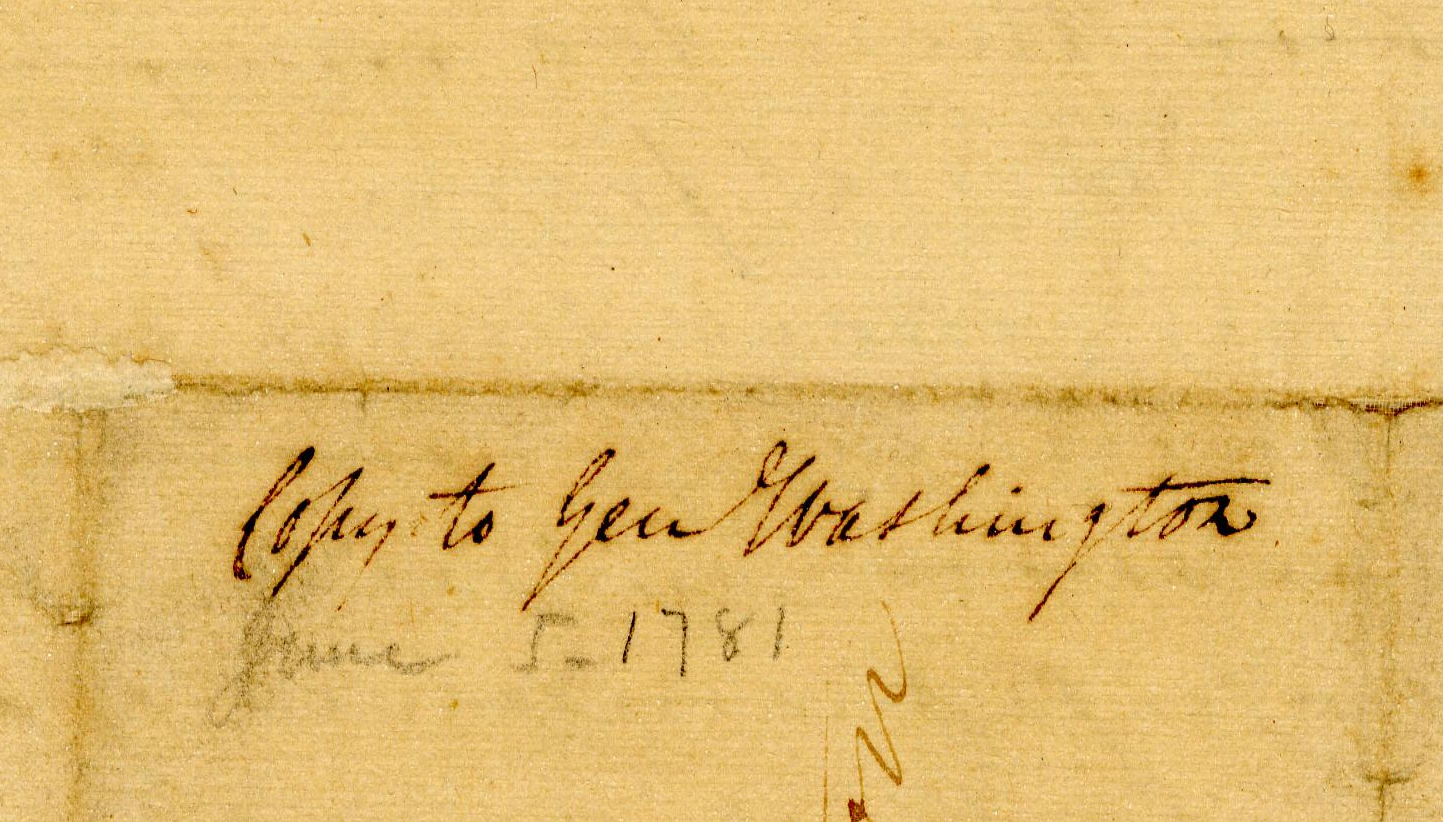Copy to Gen^l Washington
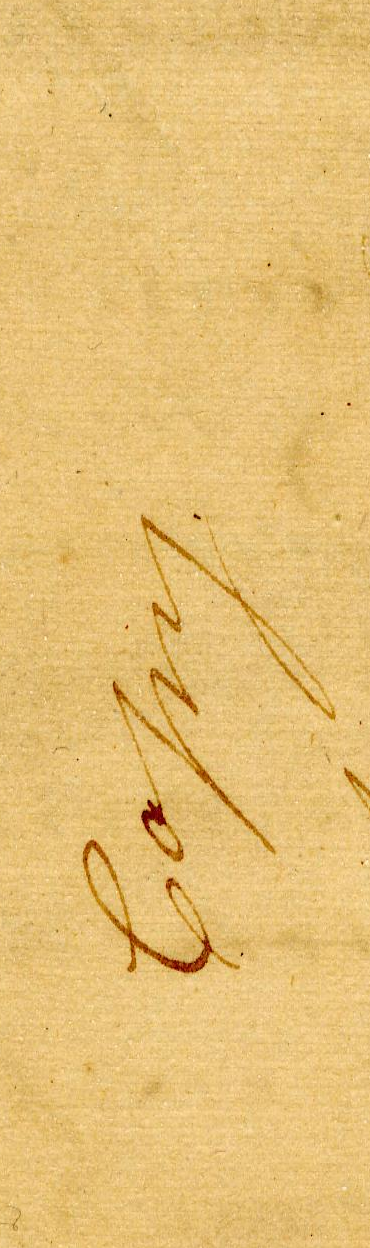Copy
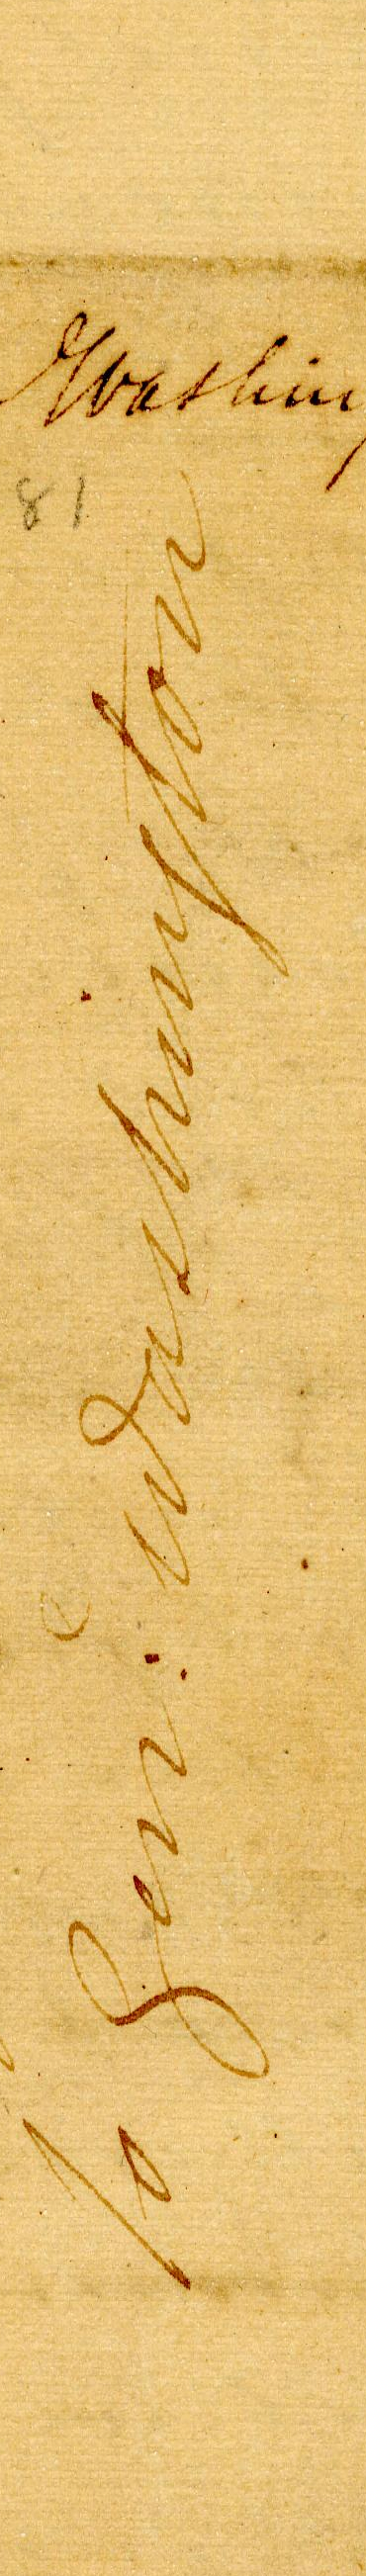to Gen^l: Washington
